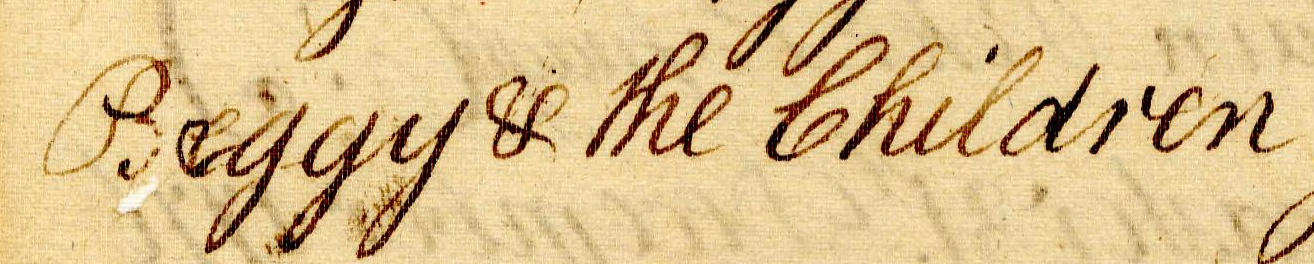Peggy & the Children
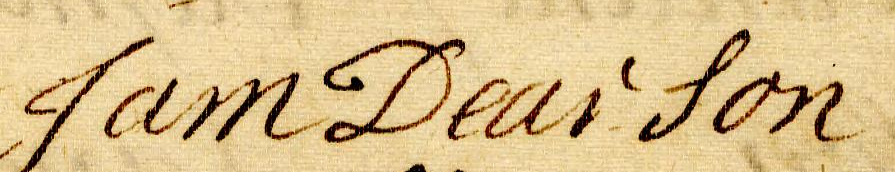I am Dear Son
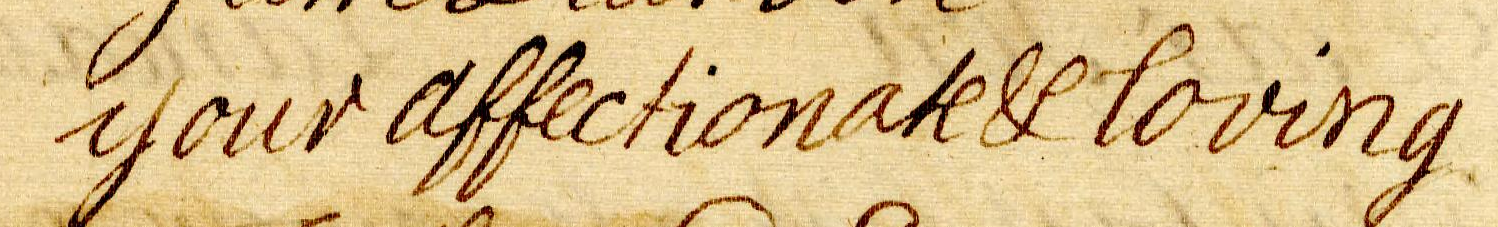Your Affectionate & loving
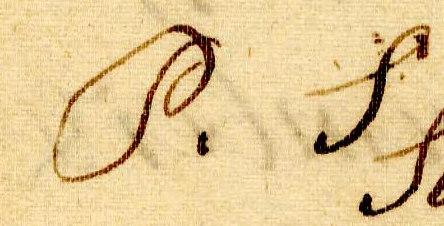P.S
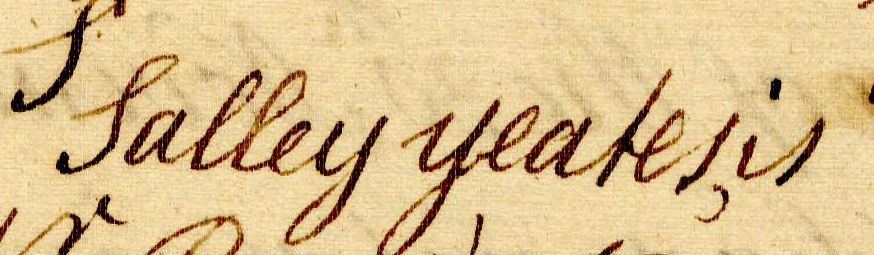Salley Yeates is
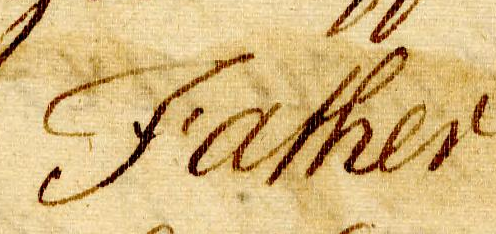Father
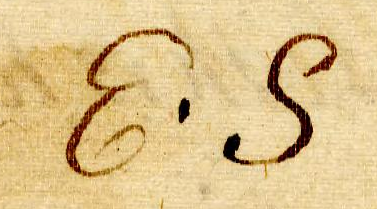E.S
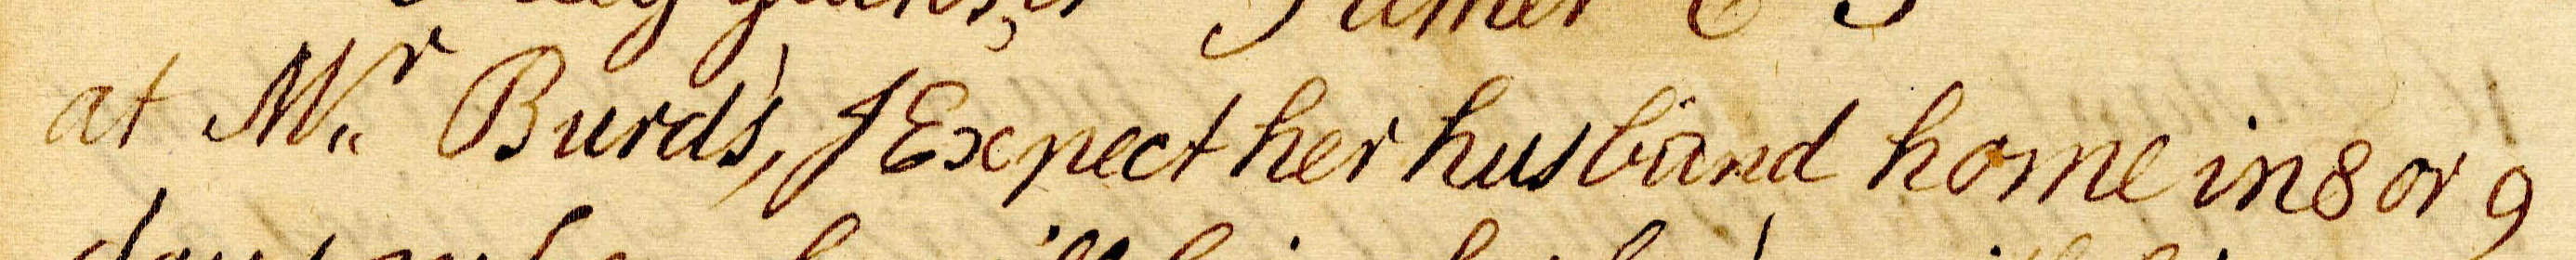at M^r. Burd's, I expect her husband home in 8 or 9
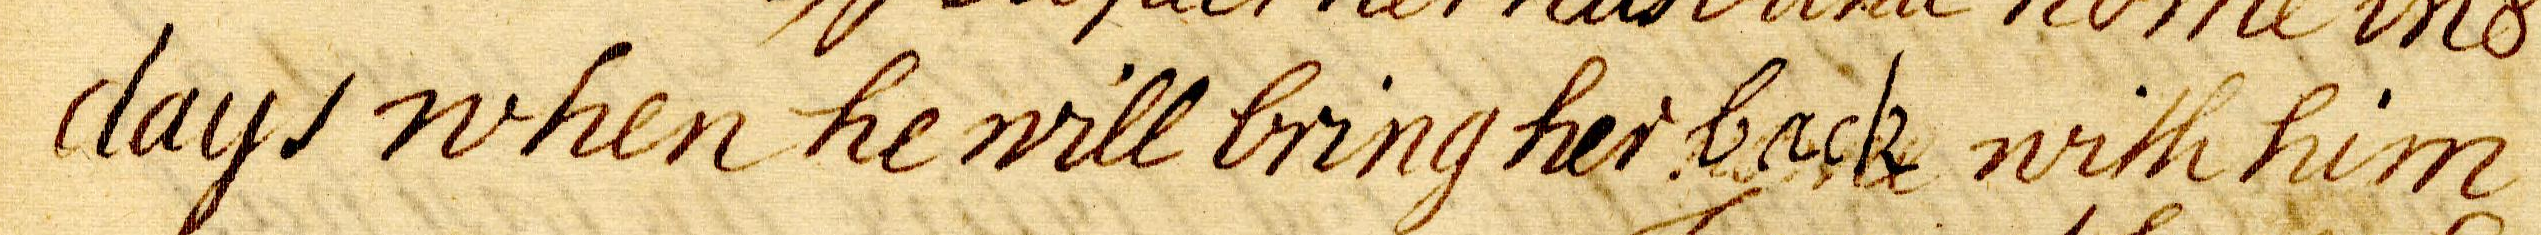days when he will bring her back with him
